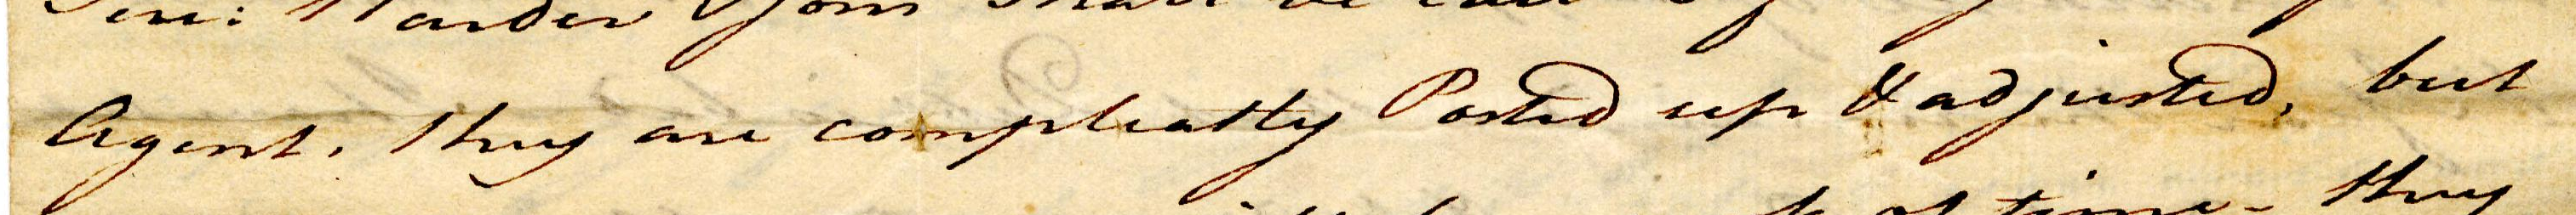Agent. They are compleatly Posted up & adjusted, but
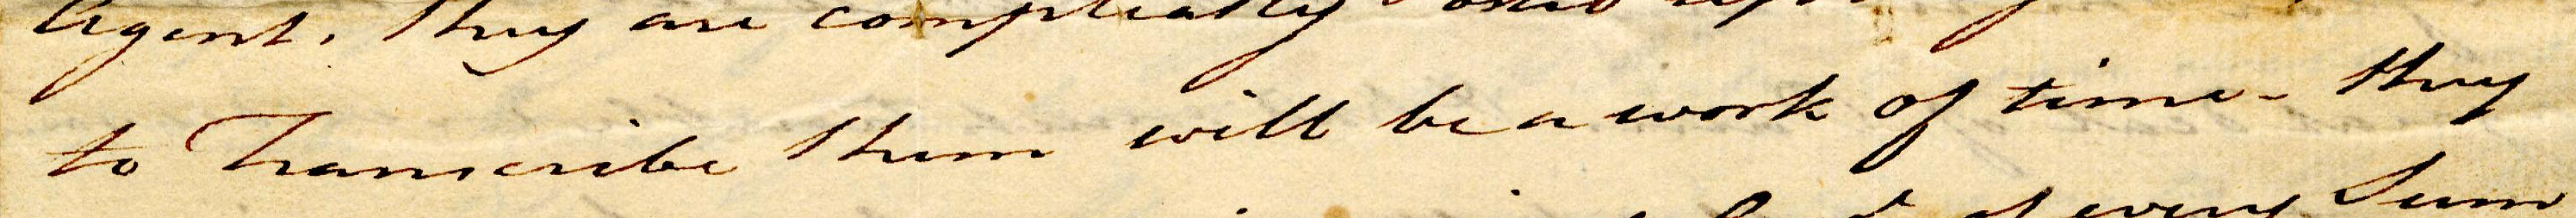to Transcribe Them will be a work of time- they
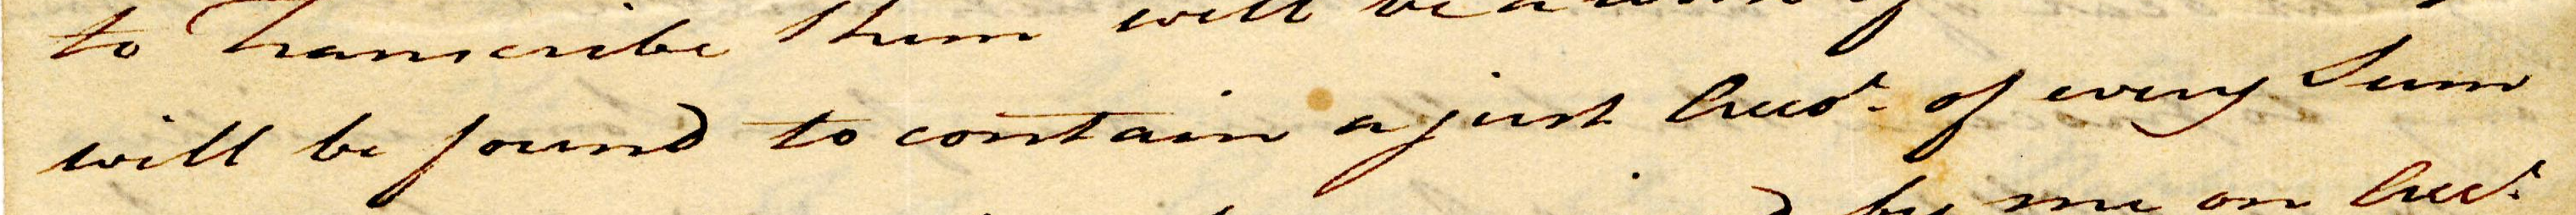will be found to contain a just Acco^t. of every Sum
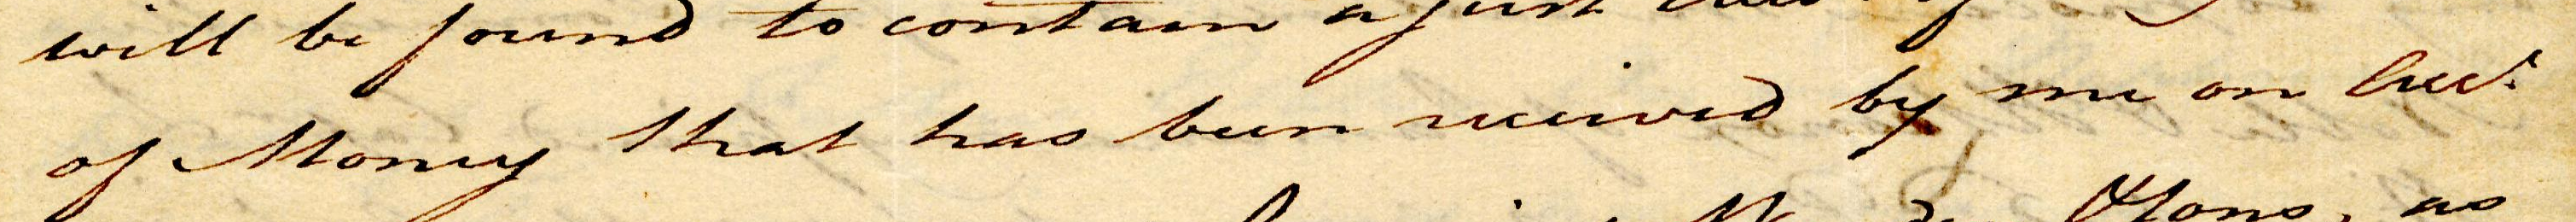of Money that has been received by me on Acc^t.
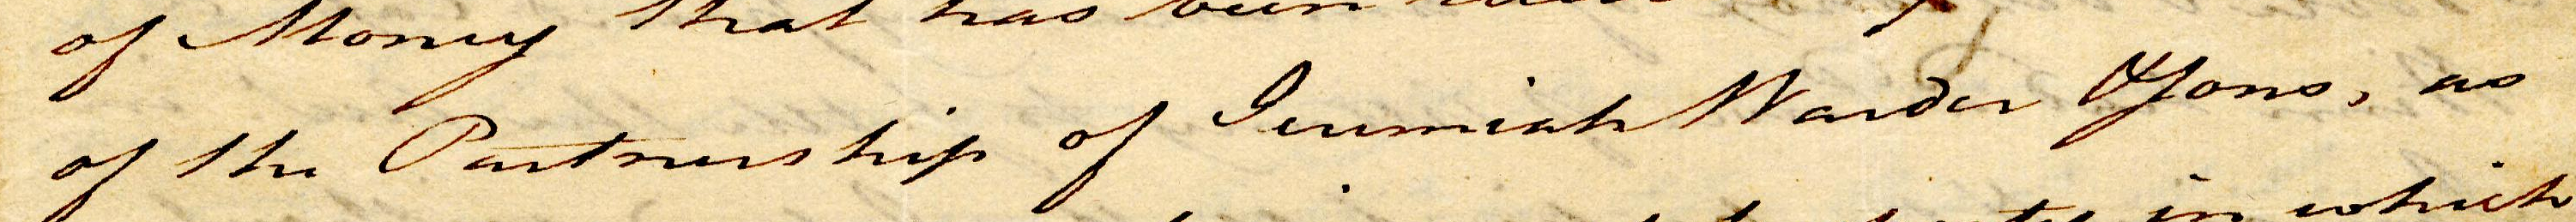of the Partnership of Jeremiah Warder & Sons, as
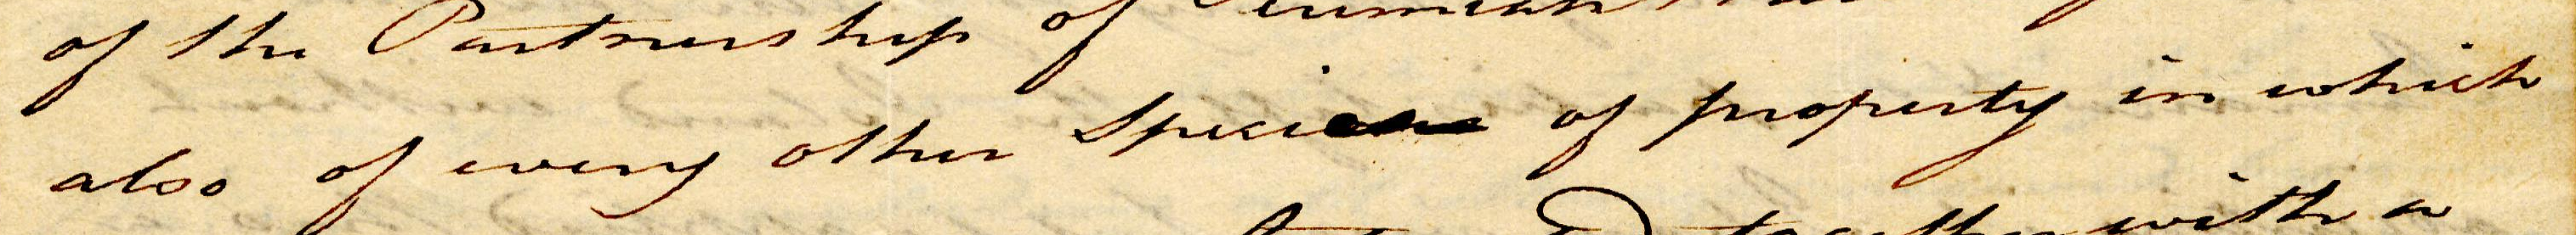also of every other species of property in which
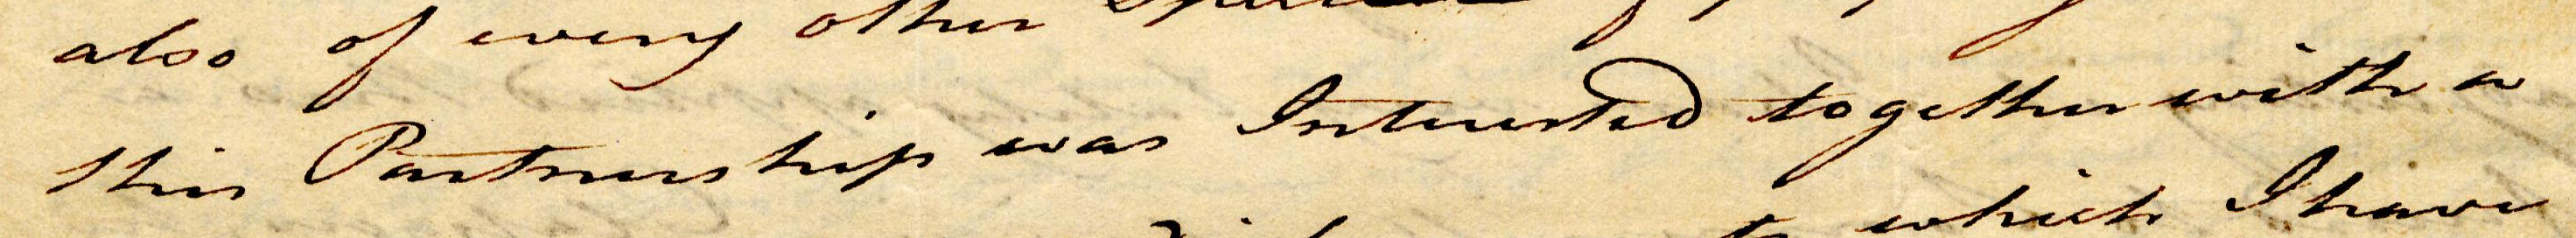this Partnership was Intrusted together with a
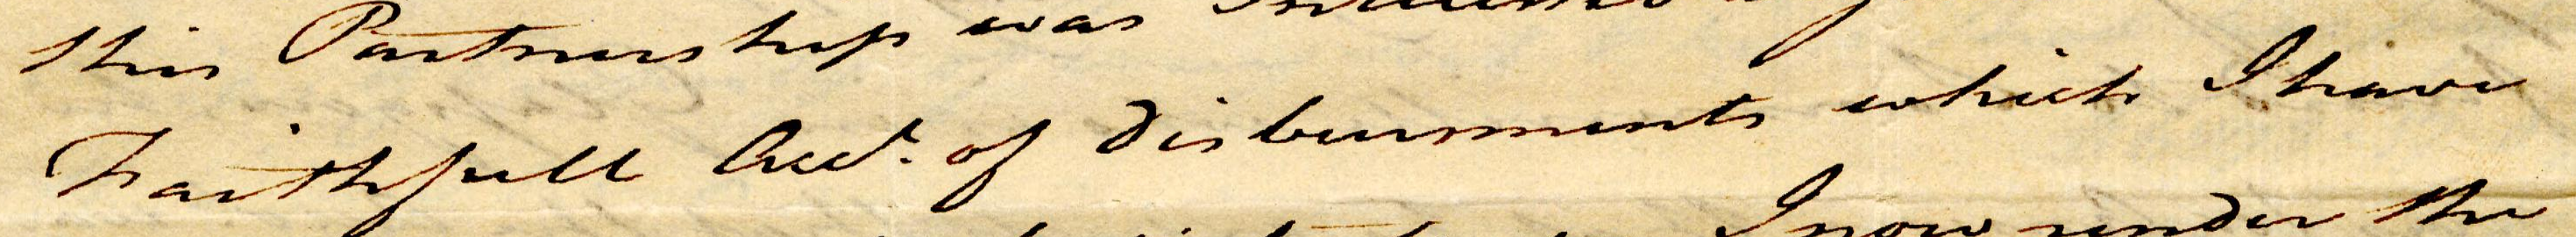Faithfull Acc^t. of disburments which I have
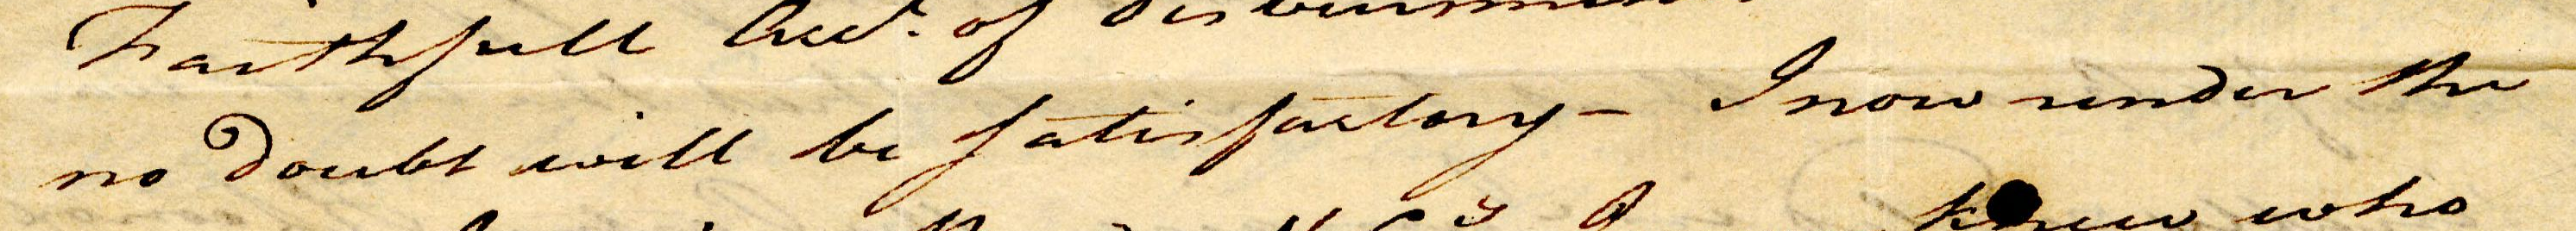no doubt will be satisfactory. I now render the
